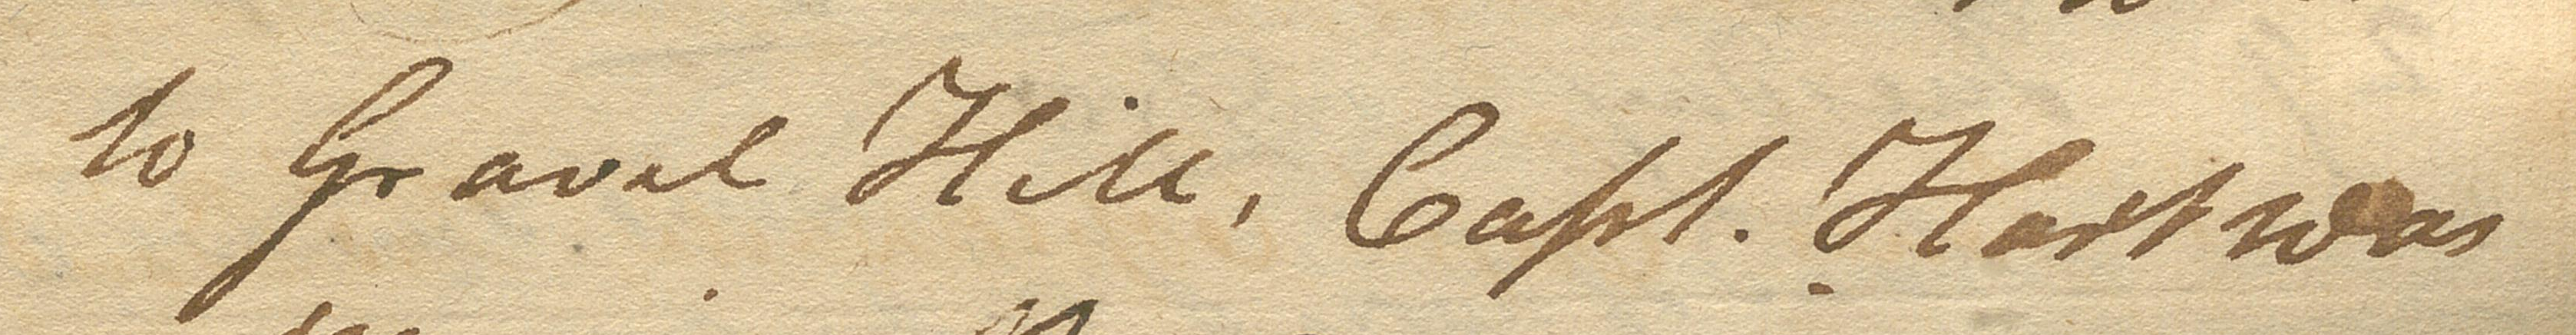to Gravel Hill, Capt. Hart was
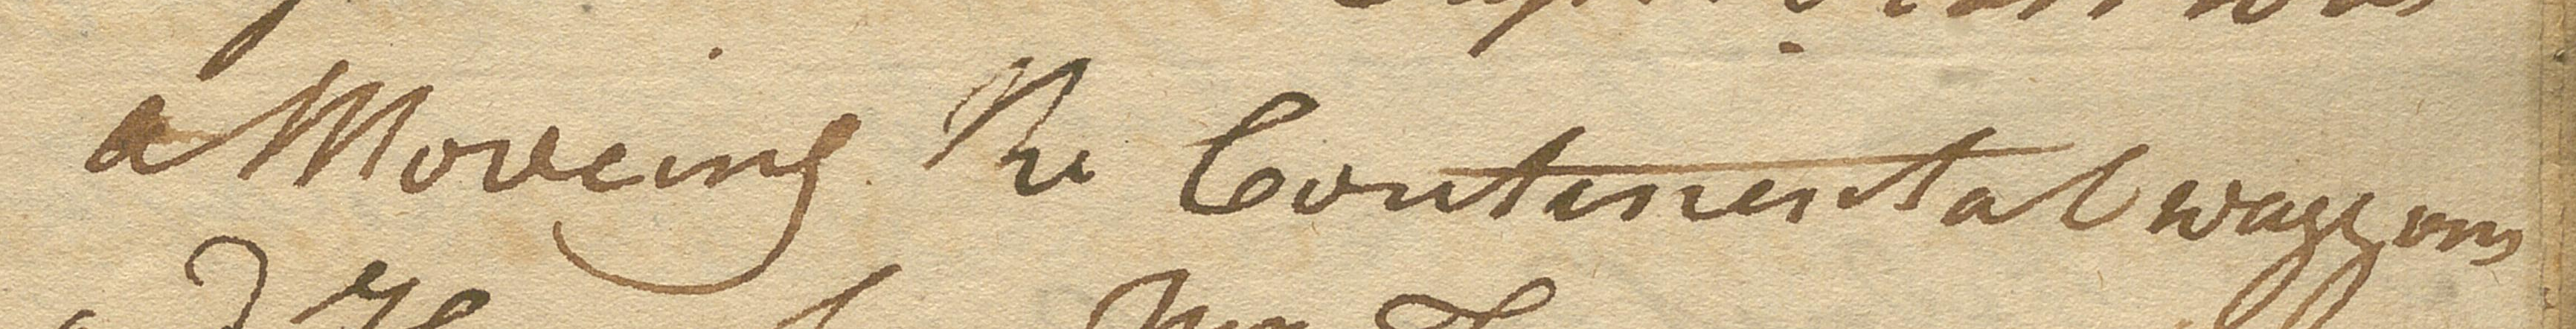a Moveing the Continental waggons
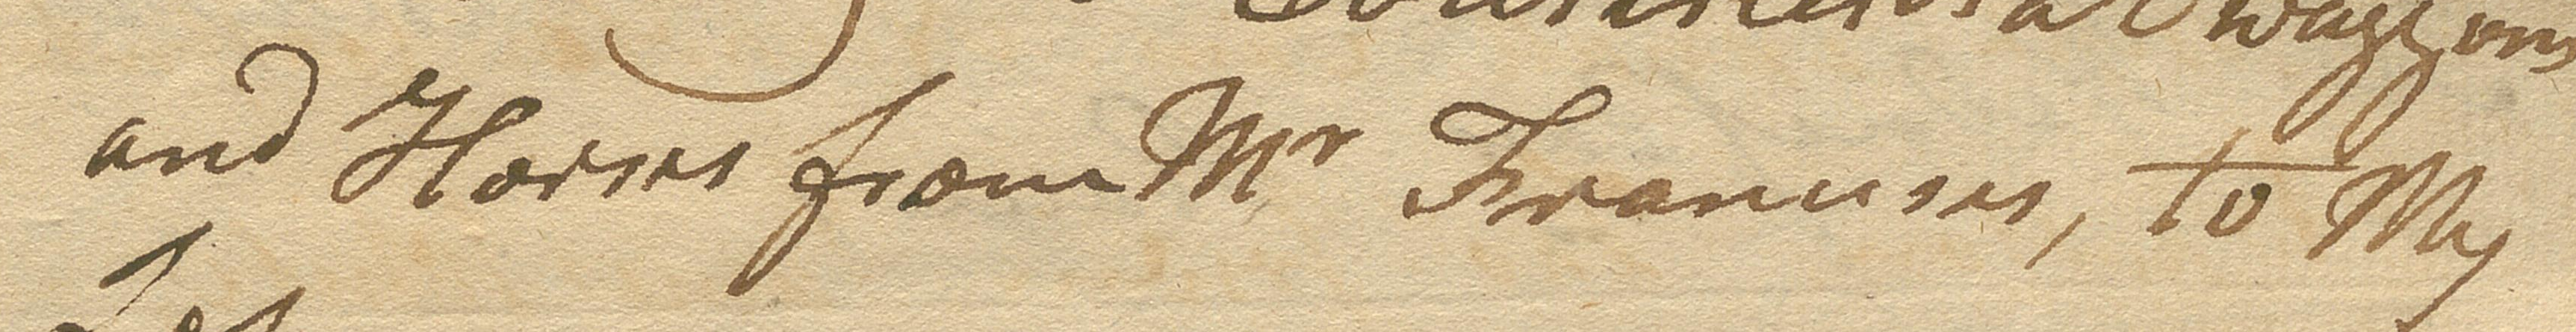and Horses from M^r. Franceses, to My
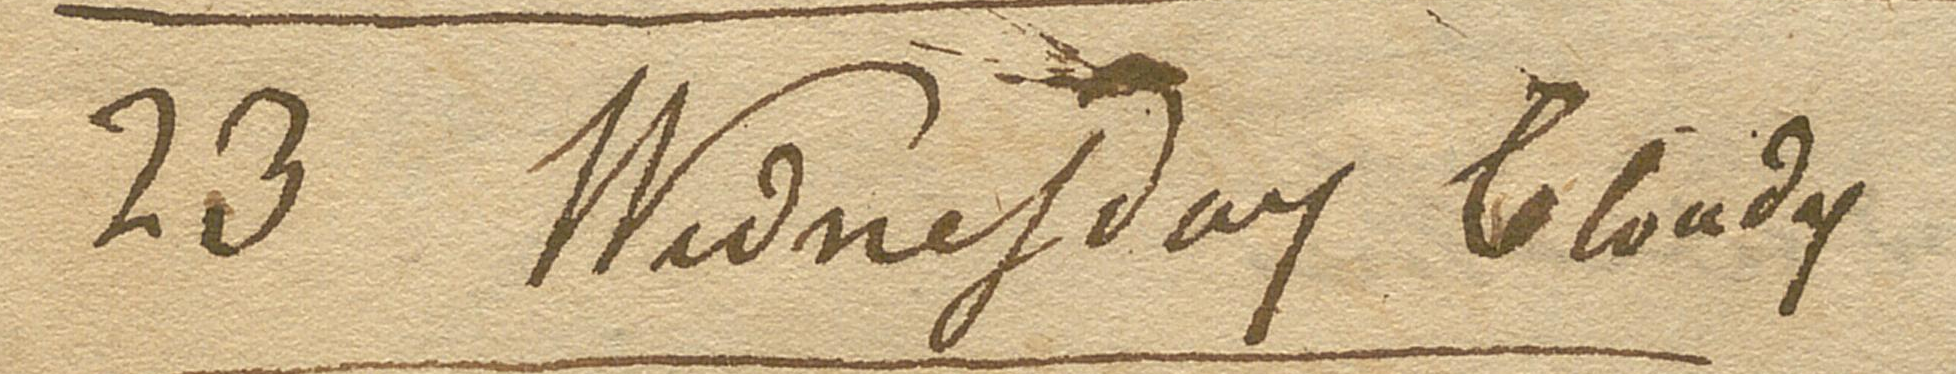23 Wednesday Cloudy
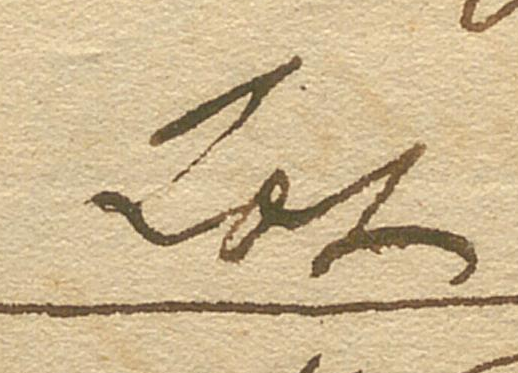Lot
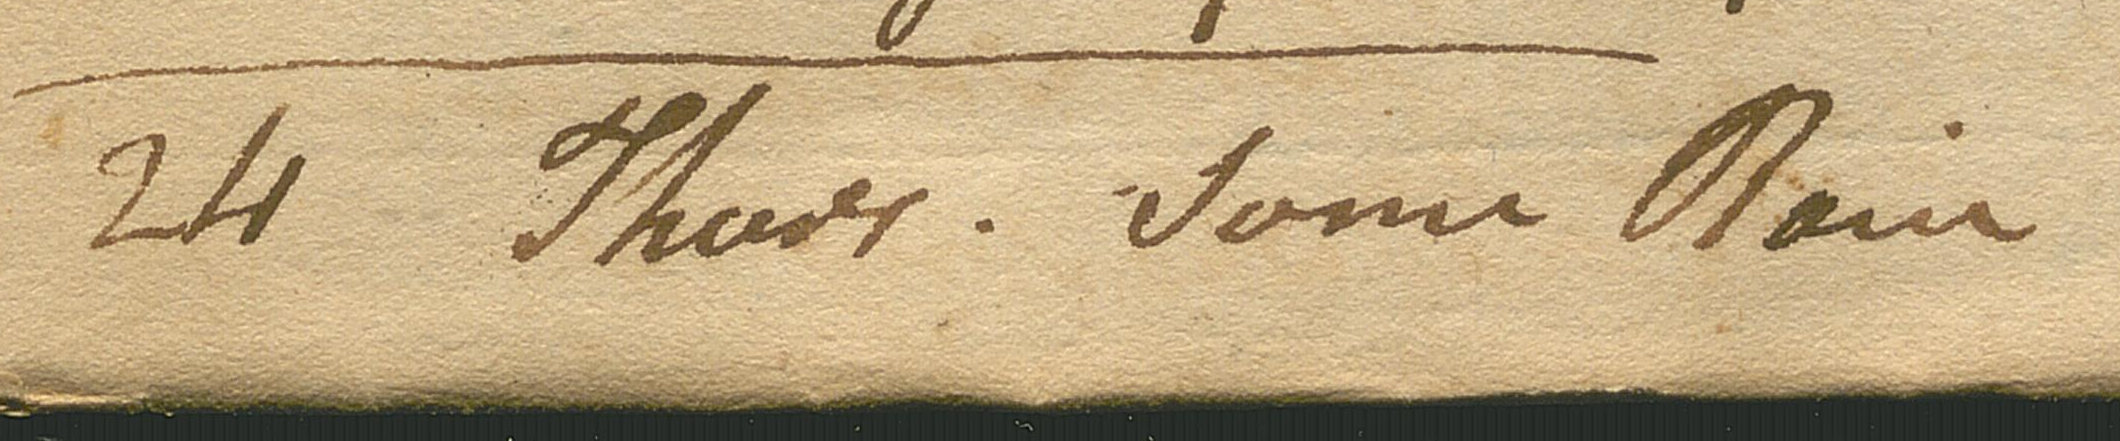24 Thurs. some Rain
